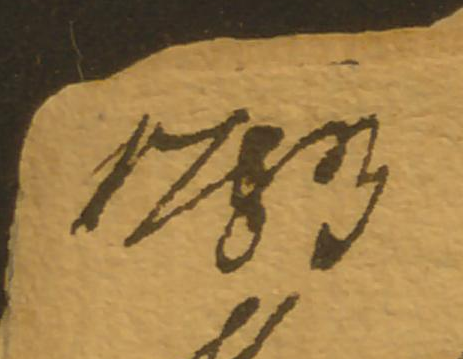1783
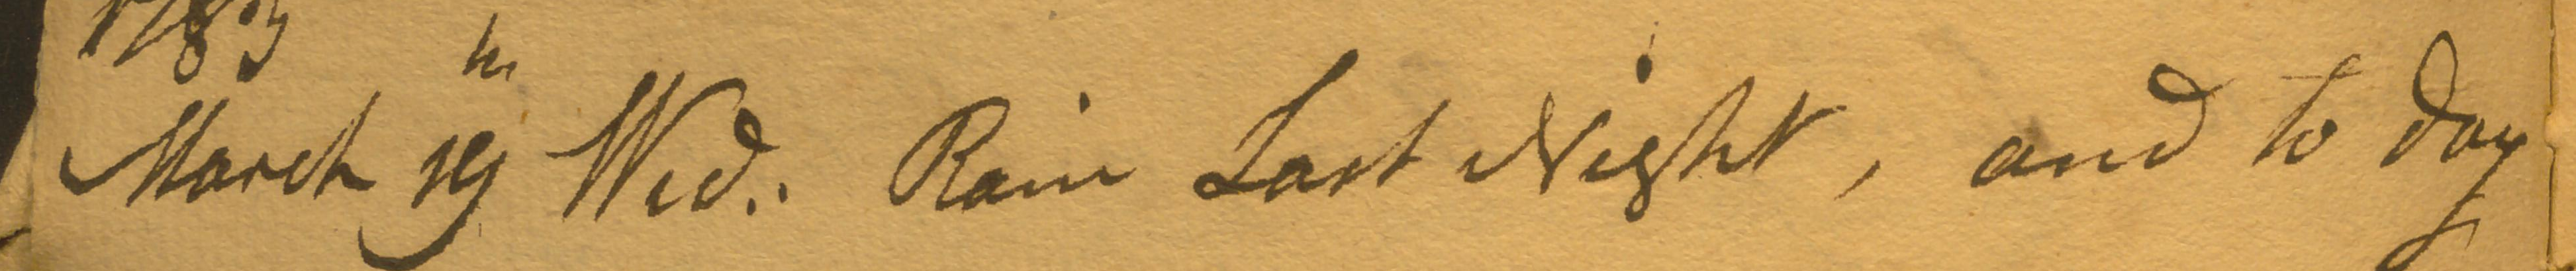March 19^th Wed. Rain Last Night, and to day
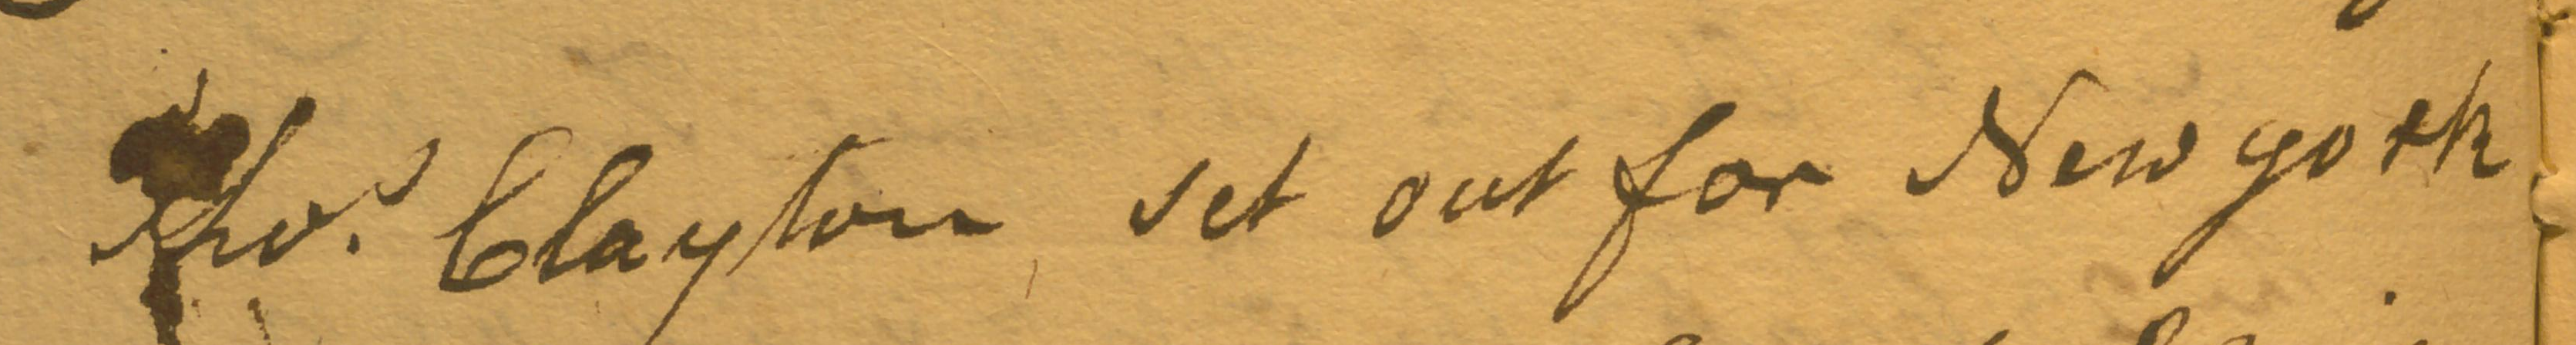Tho^s. Clayton set out for New york
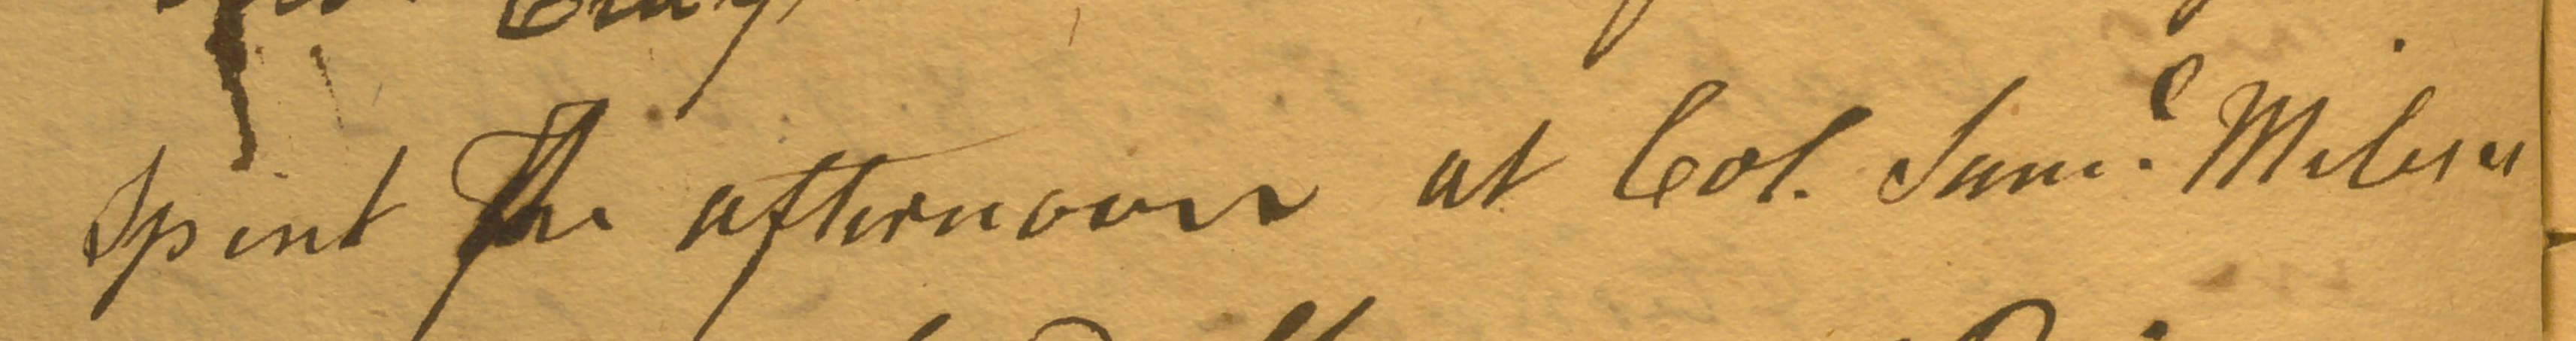spent The afternoon at Col. Sam^l. Mileses
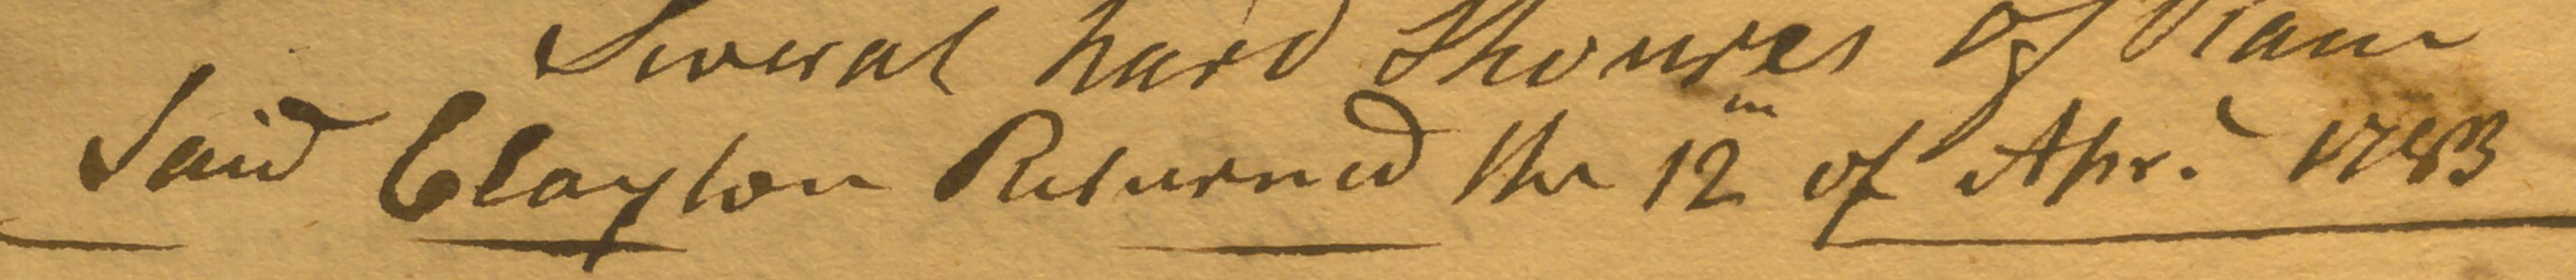Said Clayton Returned the 12^th of Apr^l. 1783
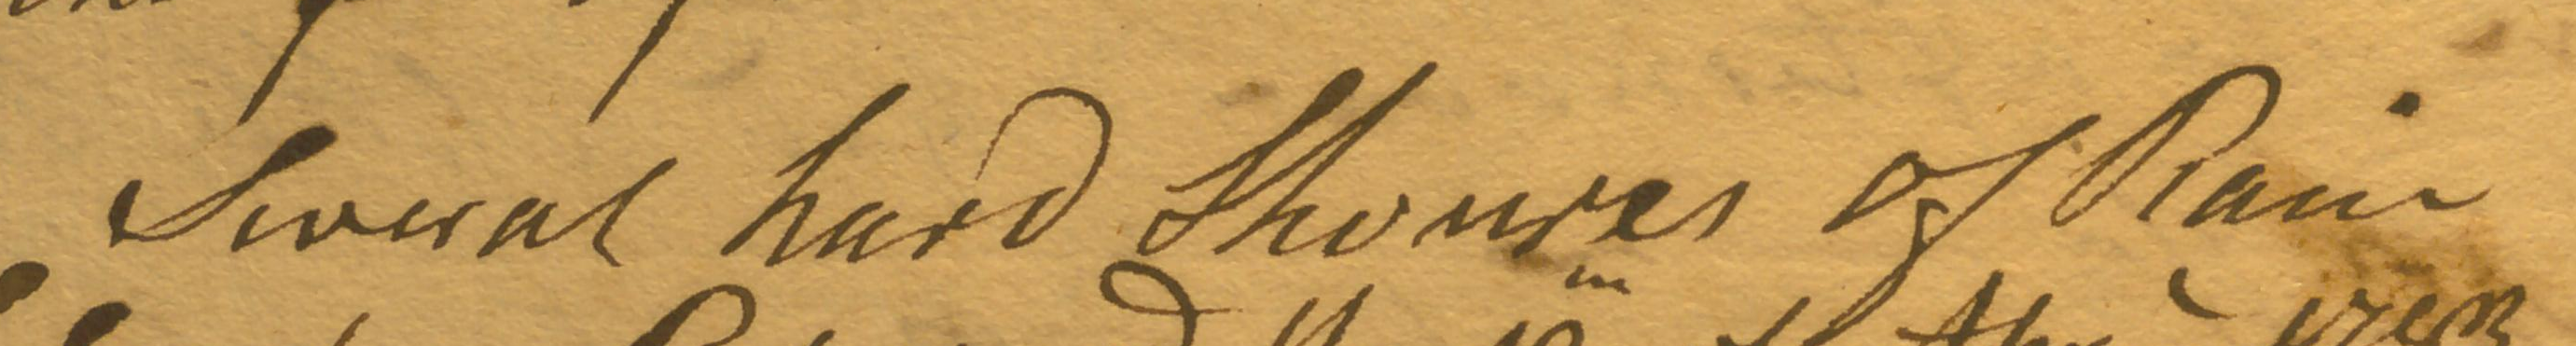Several hard Shoures of Rain
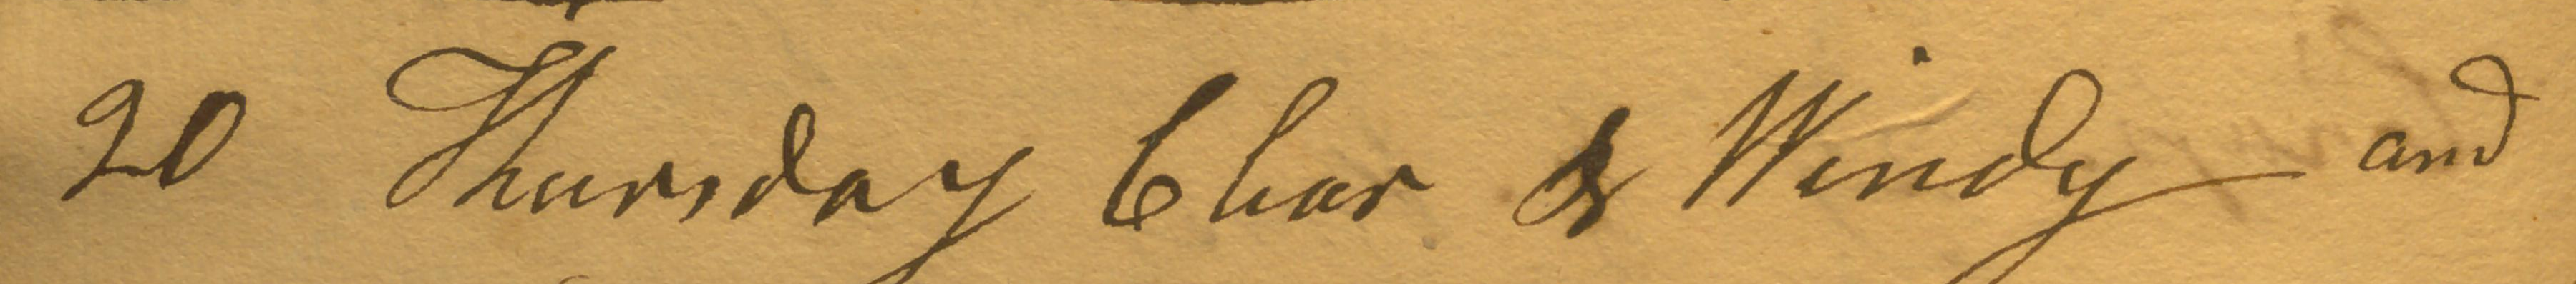20 Thursday Clear & Windy and
